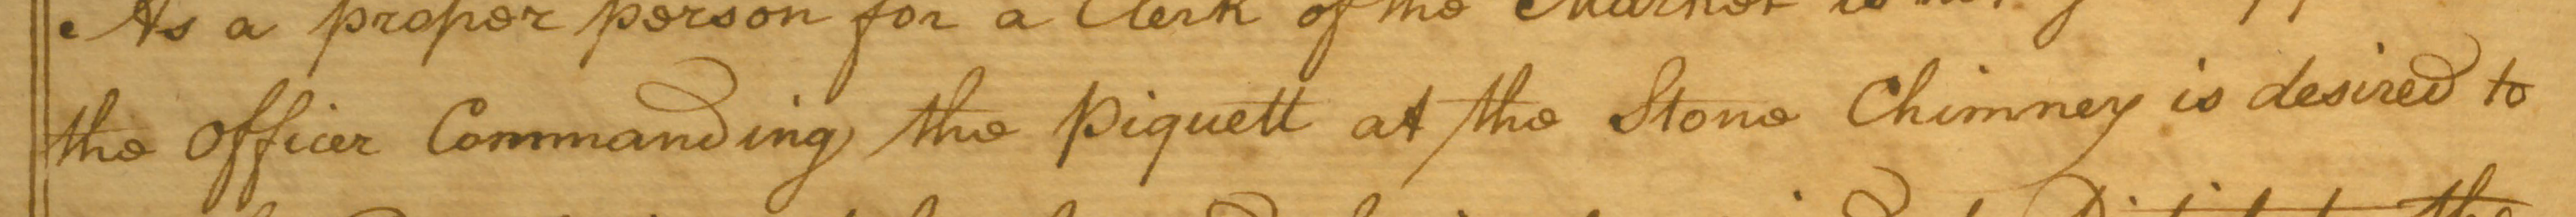the officer Commanding the picquett at the Stone Chimney is desired to
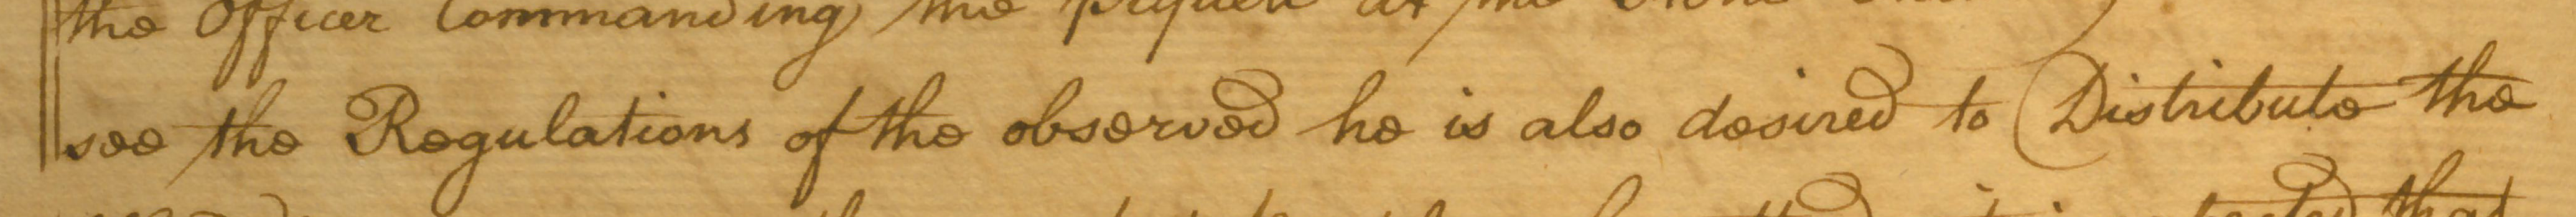see the Regulations of the observed he is also desired to Distribute the
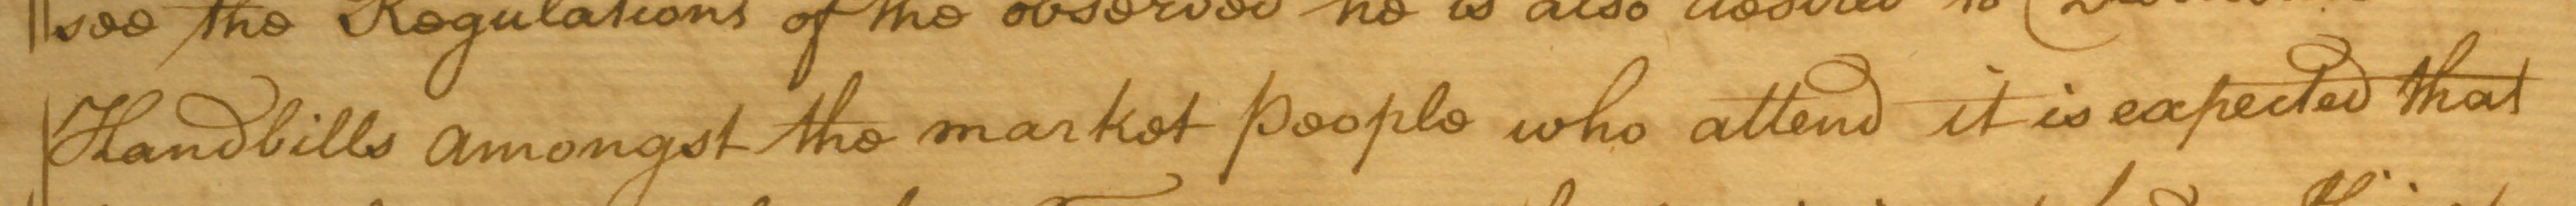Handbills amongst the market people who attend it is expected that
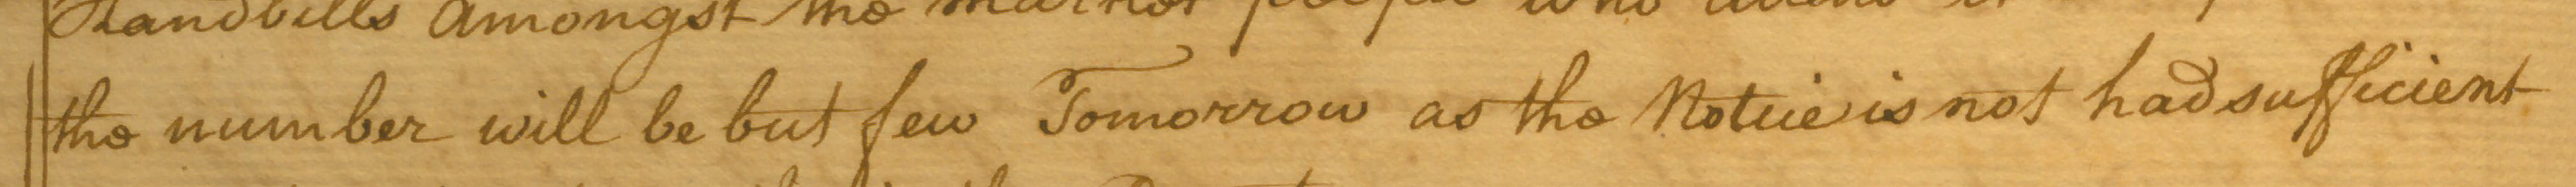the number will be but few Tomorrow as the notice is not had sufficient
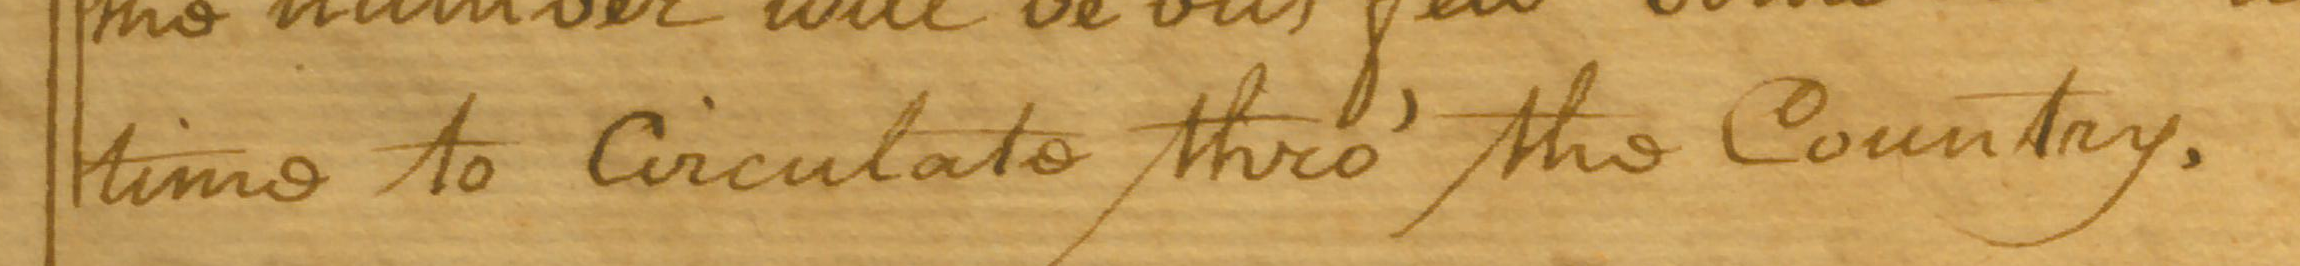time to Circulate thro' the Country.
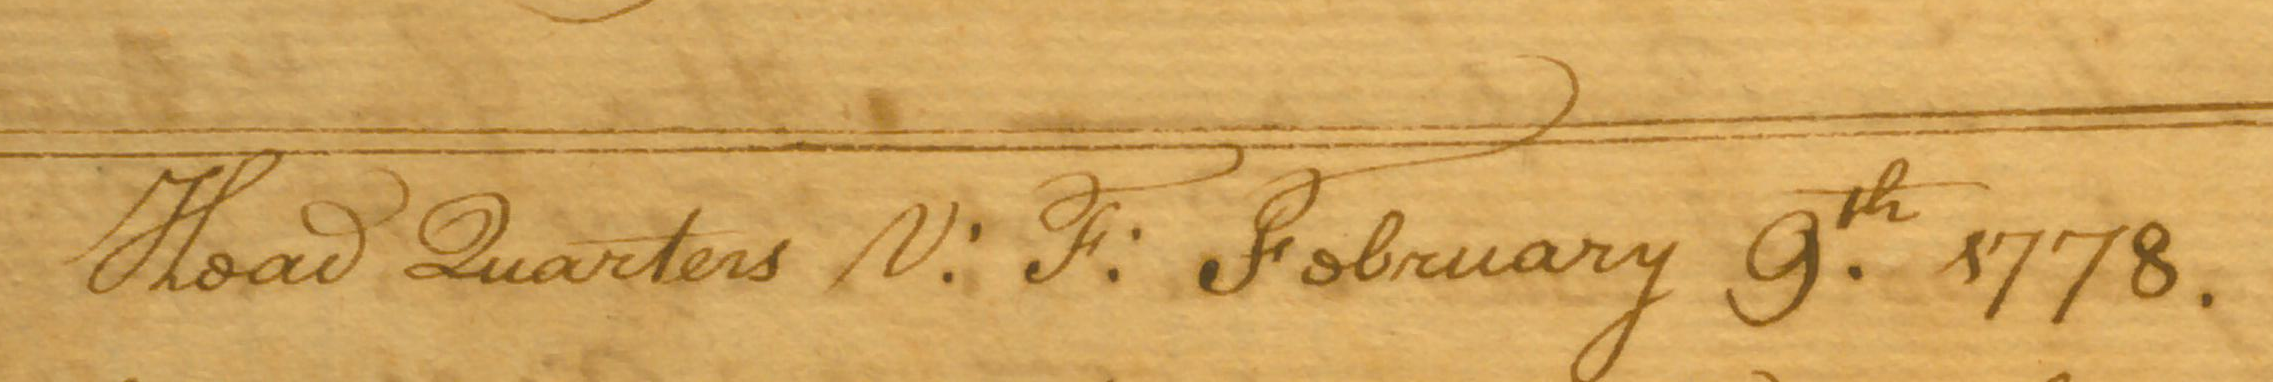Head Quarters V: F: February 9^th. 1778.
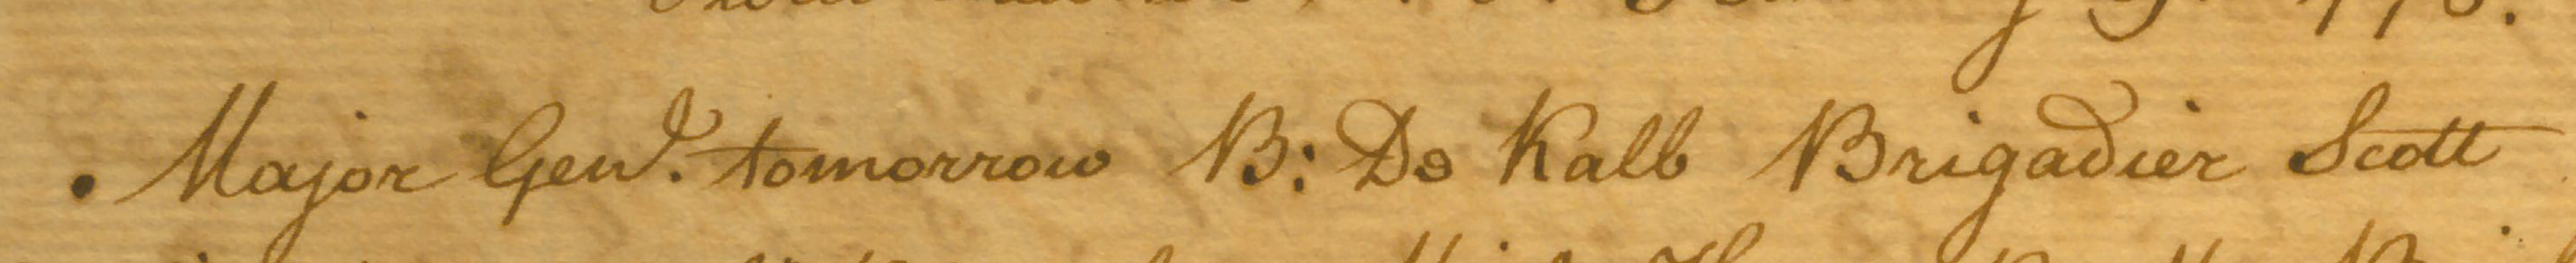Major Gen^l. tomorrow B: De Kalb Brigadier Scott
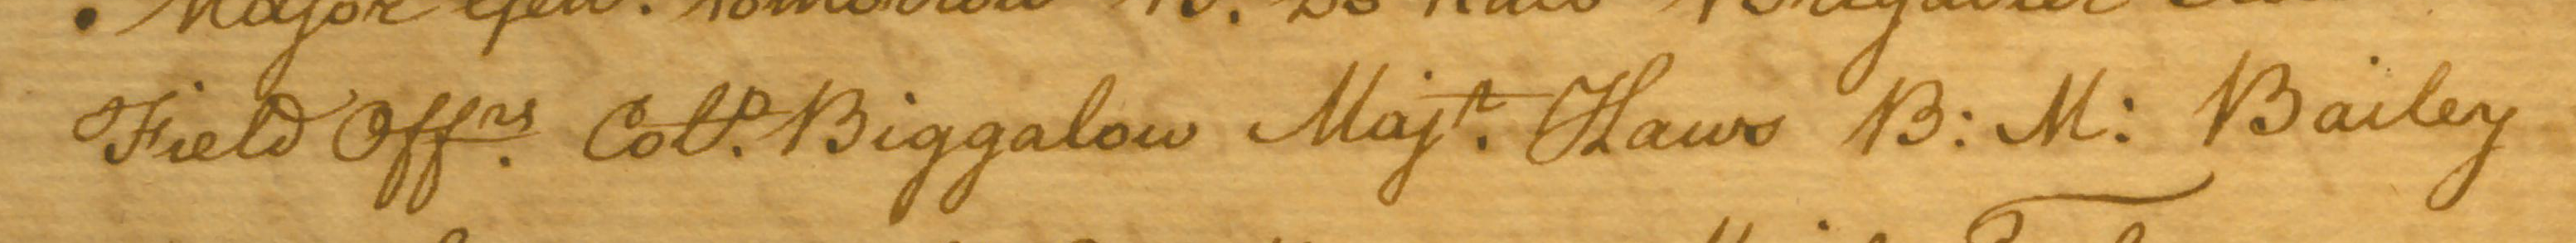Field Off^rs. Col^o. Biggalow Maj^r. Haws B: M: Bailey
